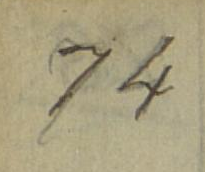74
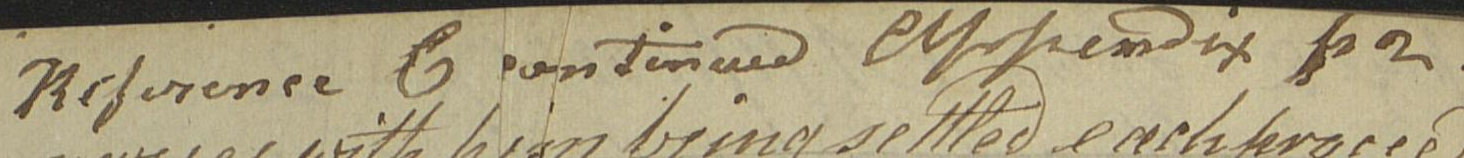Reference C continued Appendix p 2
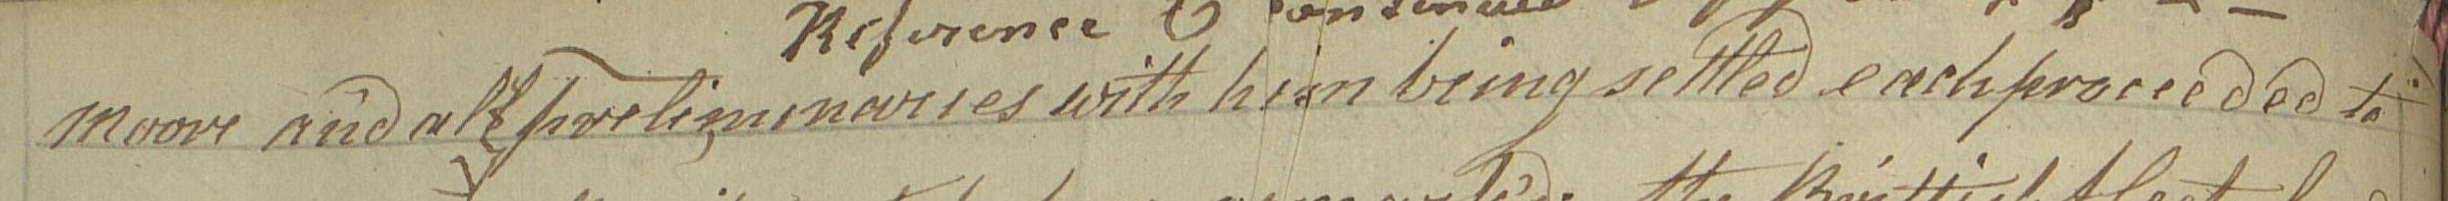moore and all preliminaries with him being settled each proceeded to
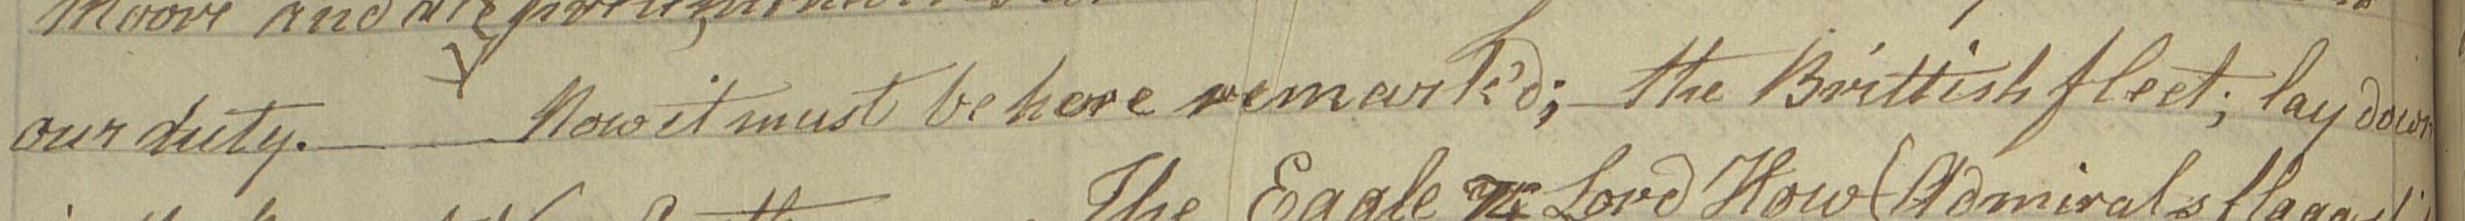our duty. Now it must be here remark'd; the Brittish fleet; lay down
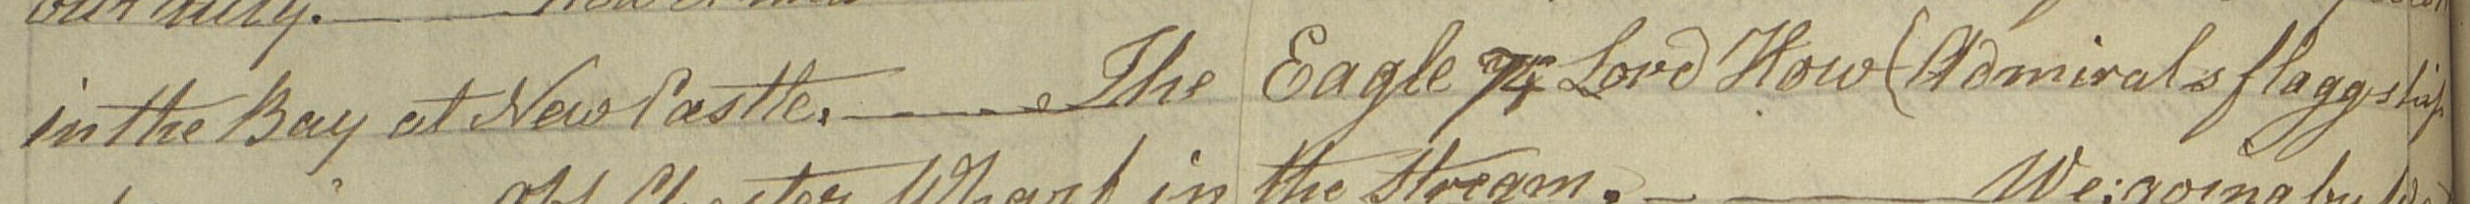in the Bay at New Castle, The Eagle 74 Lord How (Admirals flaggship
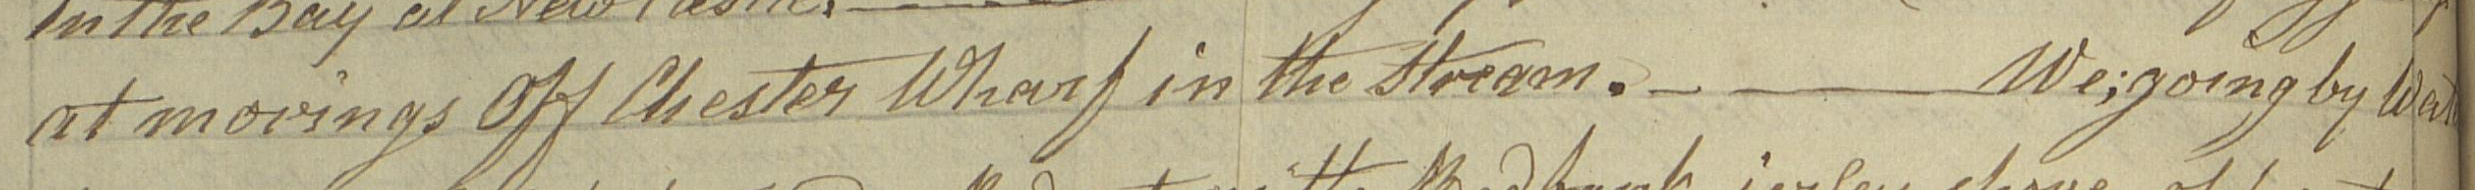at movings Off Chester Wharf in the Stream. We going by Wa-
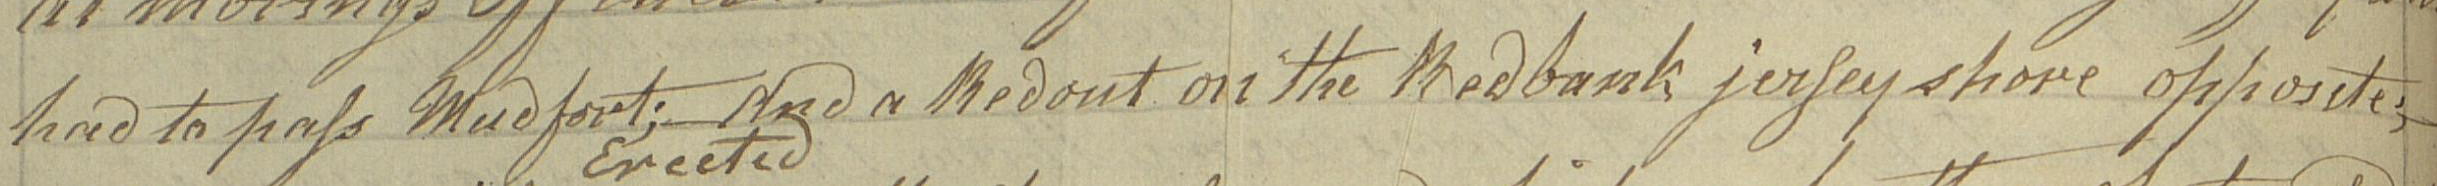had to pass Mudfort; and a Redout on the Redbank jersey shore opposite;
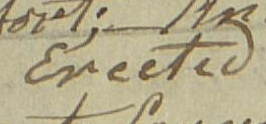Erected
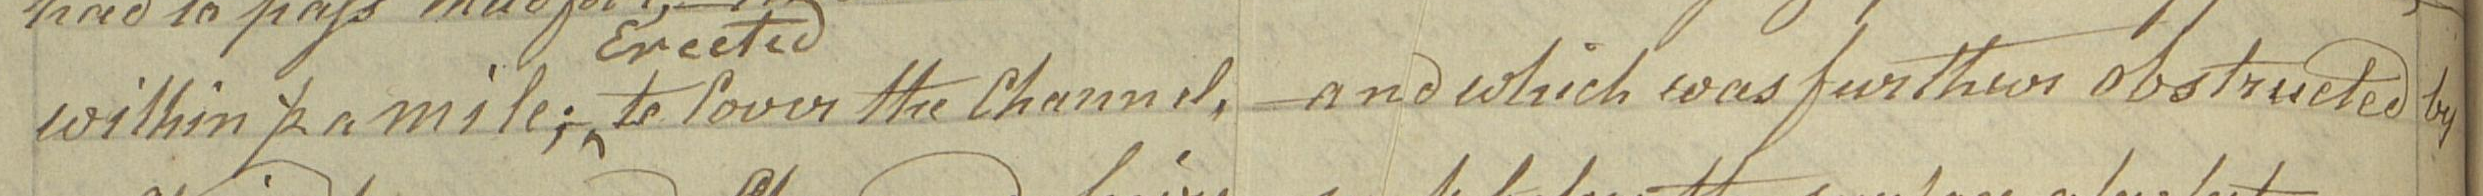within p a mile; ^ to Cover the Channel, and which was further obstructed by
